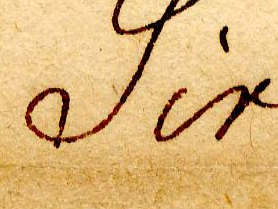Sir
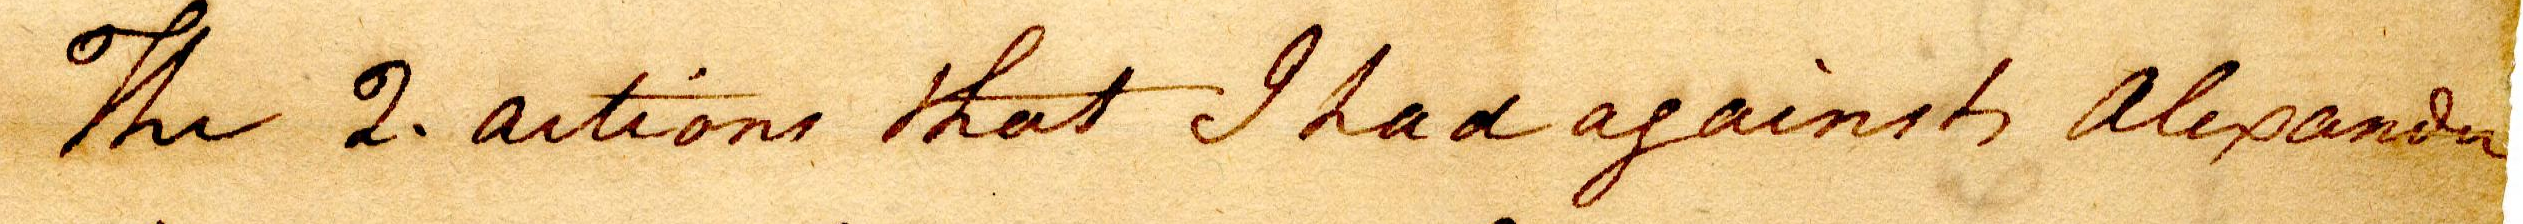The 2 actions that I had against Alexander
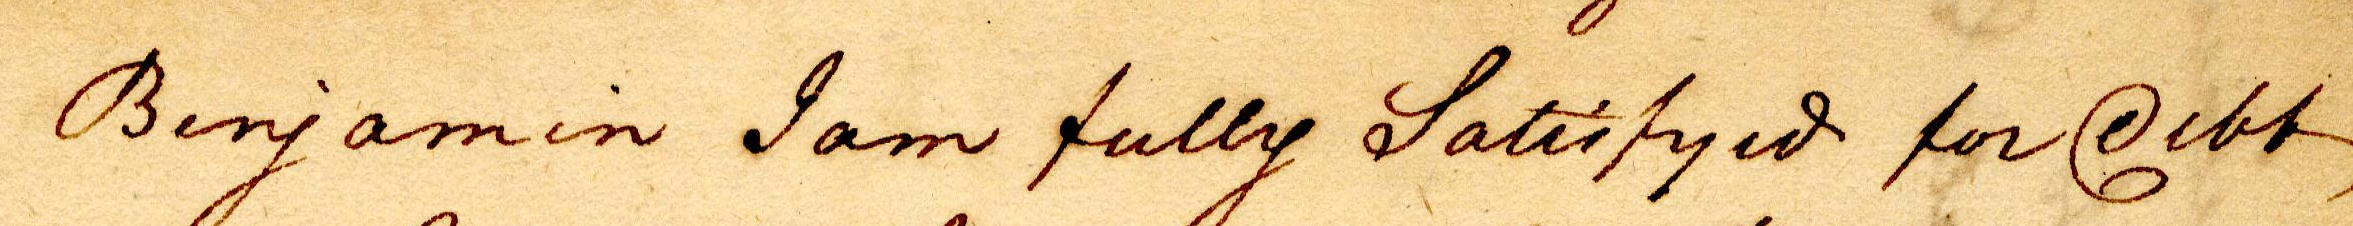Benjamin I am fully Satisfyed for debt
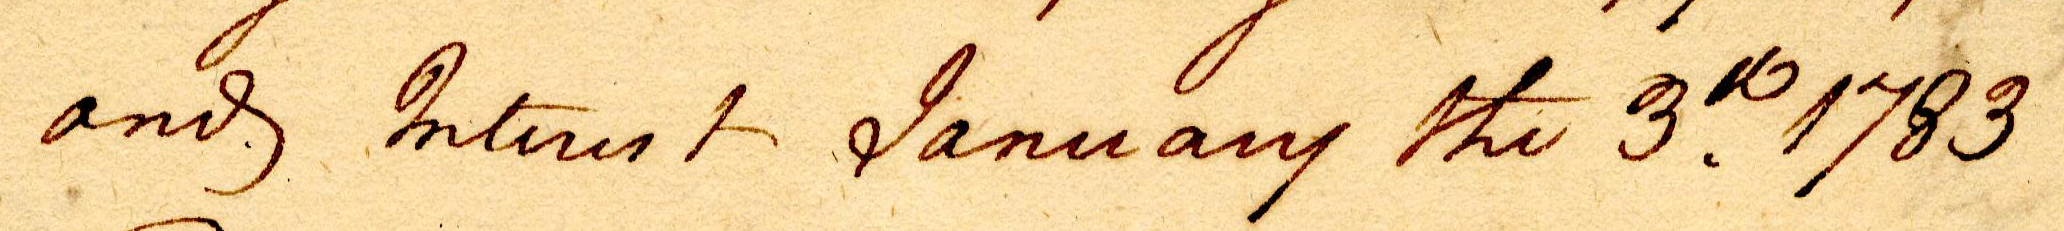and Interst January the 3^d. 1783
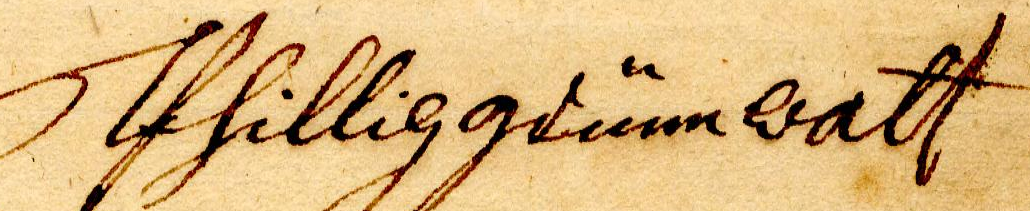Phillip Greenwalt
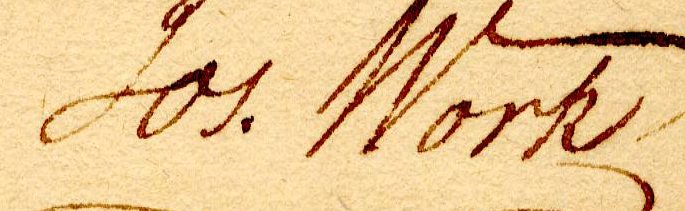Jos. Work
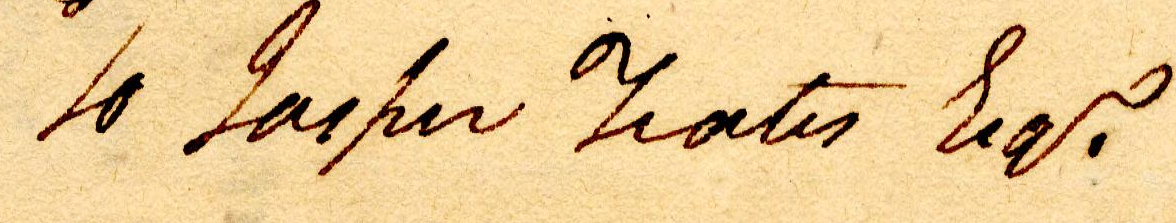Jasper Yeates Esq^r.
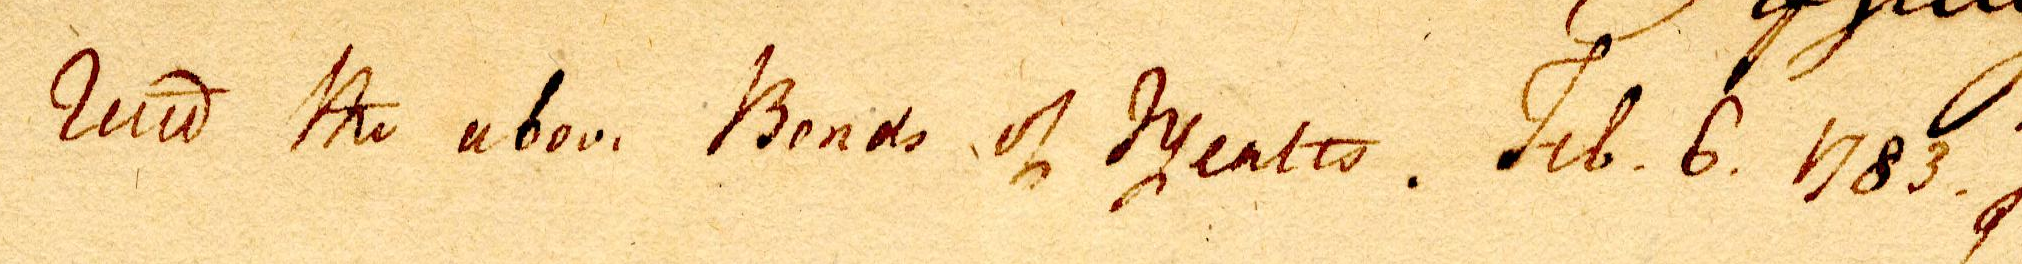Reced the above Bonds of JYeates, Feb. 6. 1783.
